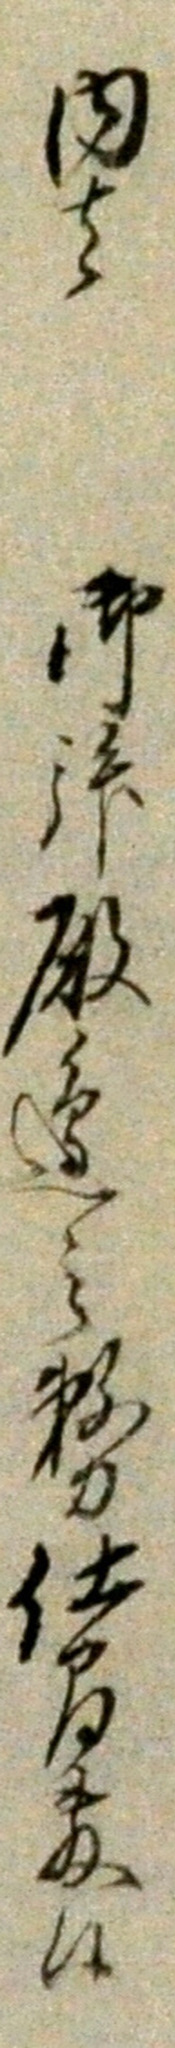内は御拝殿辺之務仕間敷候
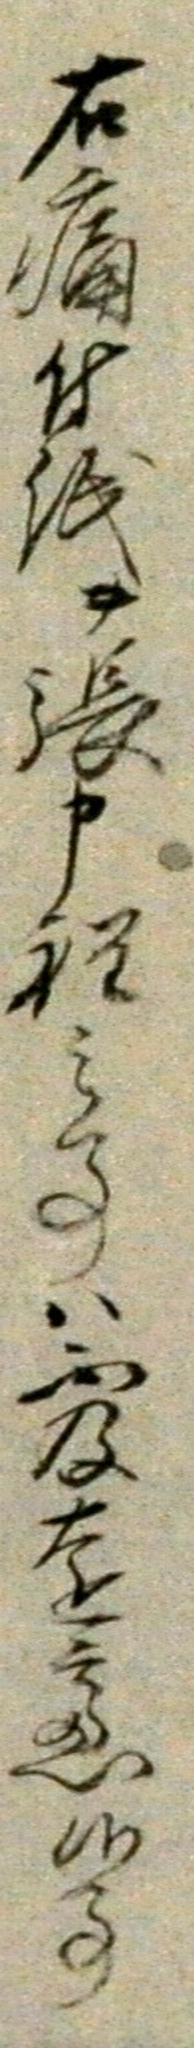右痛付紙ヲ張申程之事ハ不及遠慮候事
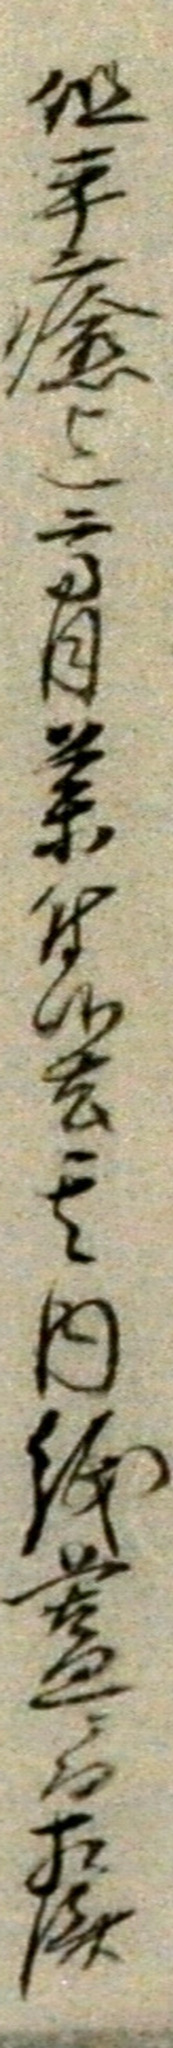但平癒迄膏薬付候共其内紙蓋ニ而相済
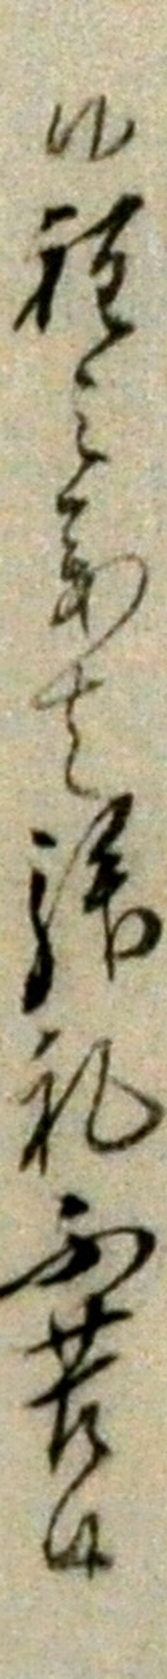候程之義は拝礼不苦候

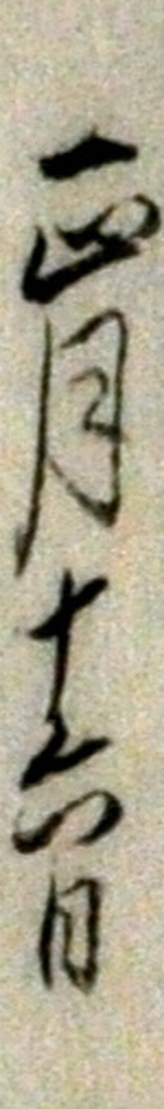正月十六日
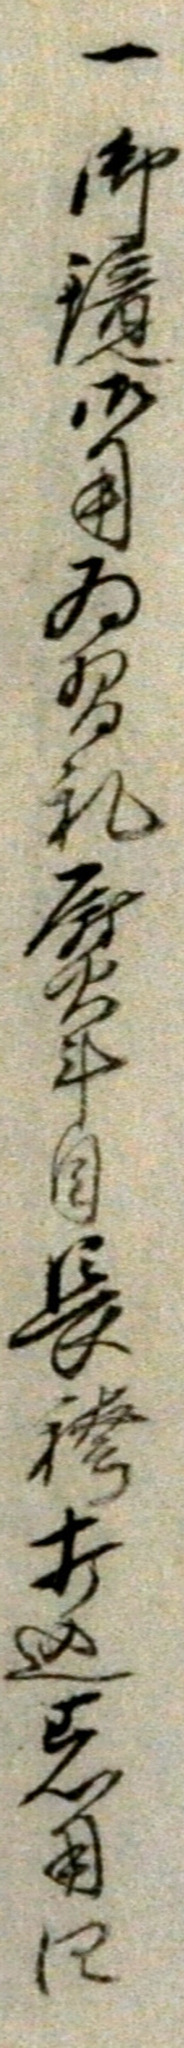一御鏡御用為習礼熨斗目長袴折込着用四
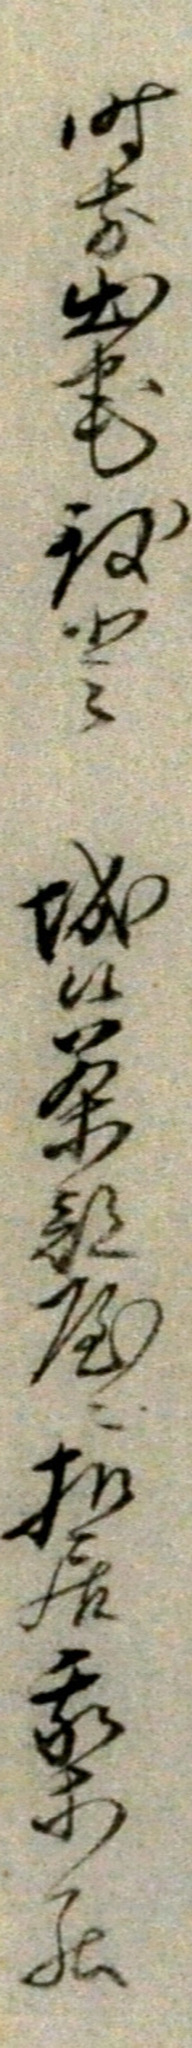時前出宅致登城候茶部屋ニ扣居我等罷
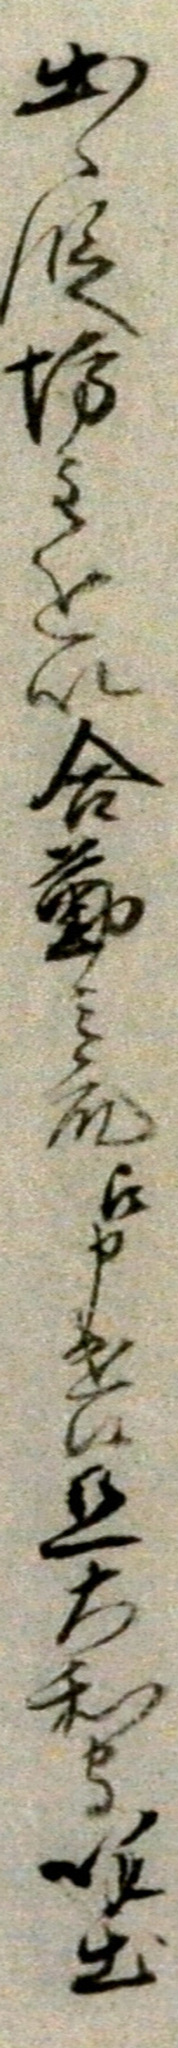出候段坊主を以合勤之衆え申遣候且大和守呼出
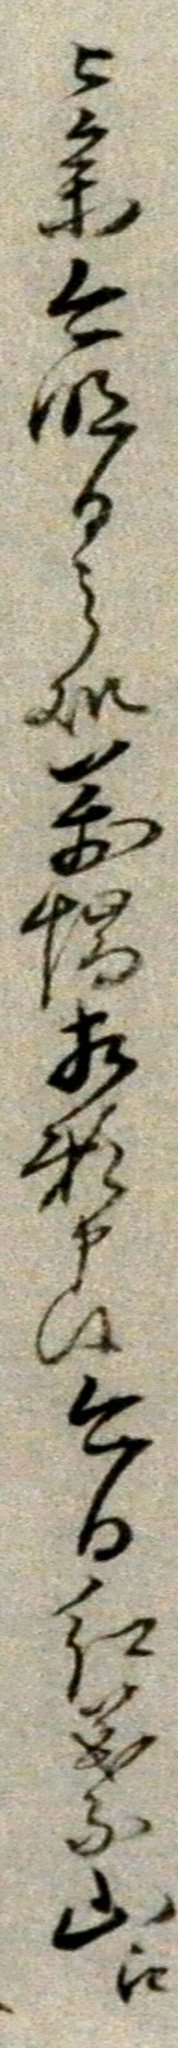被参今明日之処万端相頼申候今日紅葉山え
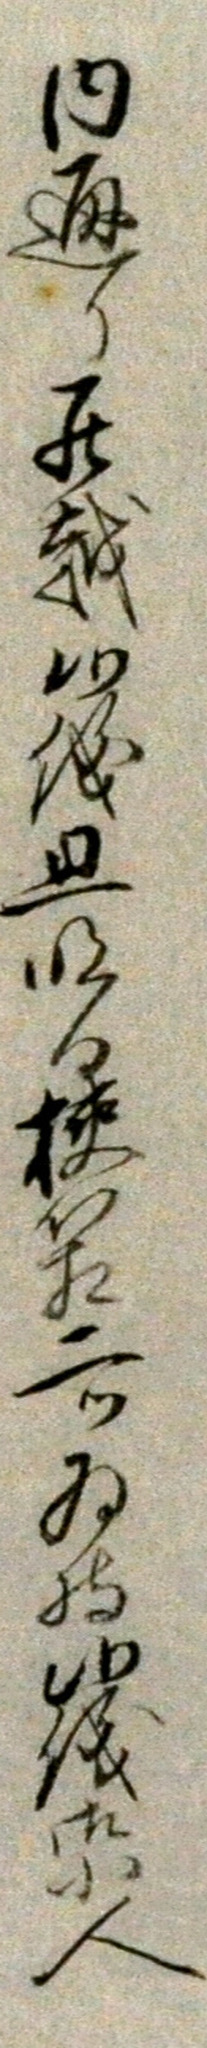内通り罷越候儀且明日挟箱二ツ為持候儀御小人
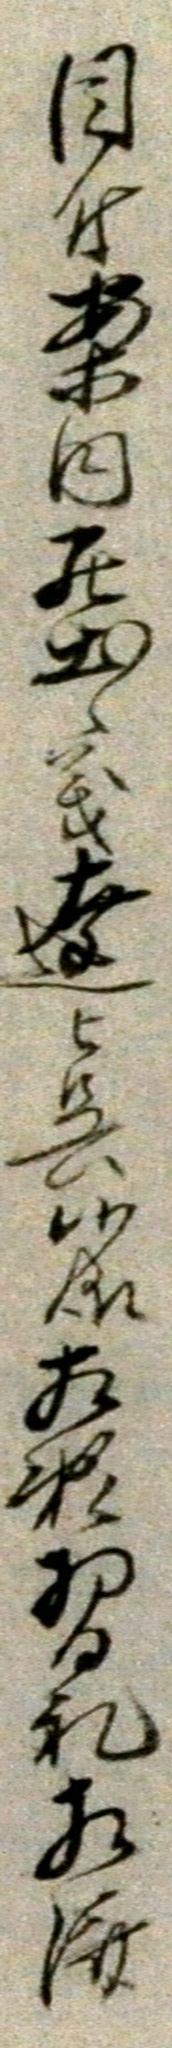目付案内罷出候義達被呉候様相頼習礼相済
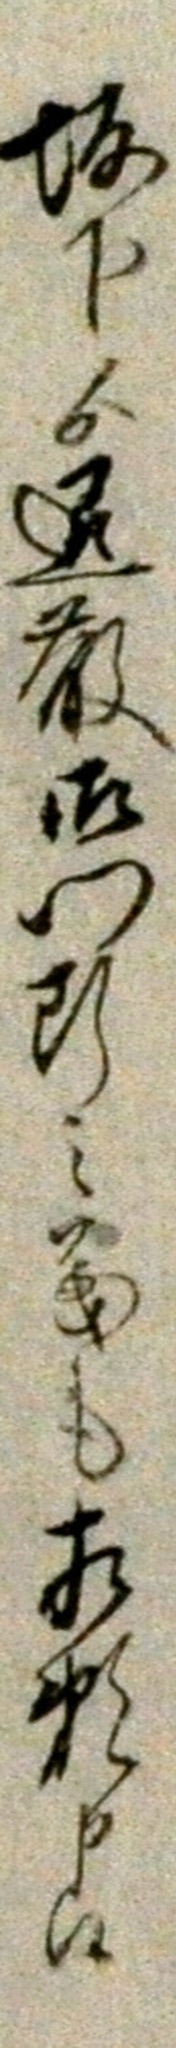坂下ゟ退散御門断之義も相頼申候
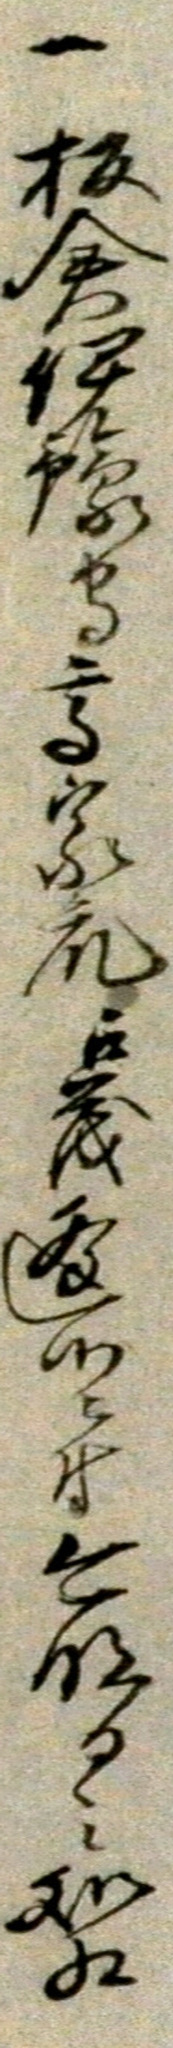一板倉伊豫守高家衆えも逢候ニ付今明日之処相
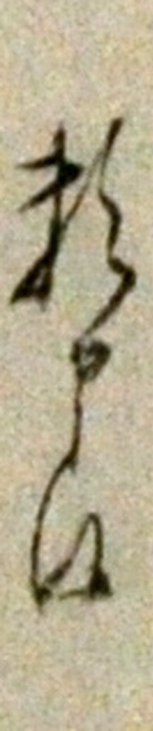頼申候
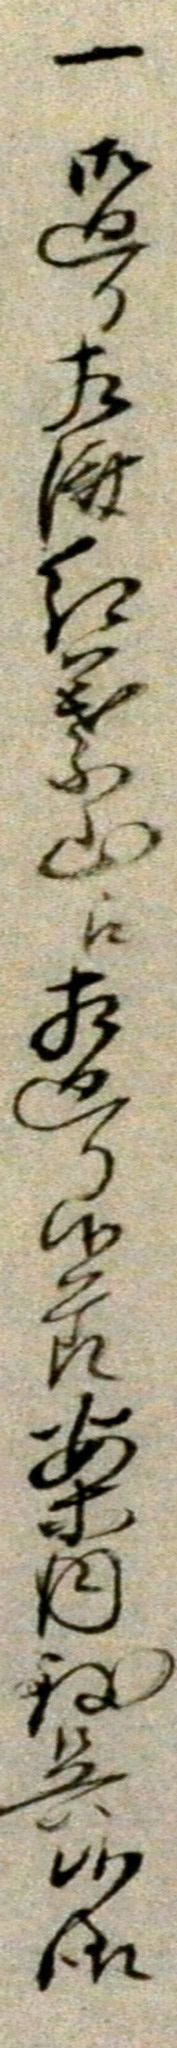一御廻り相済紅葉山え相廻り候節案内致呉候様
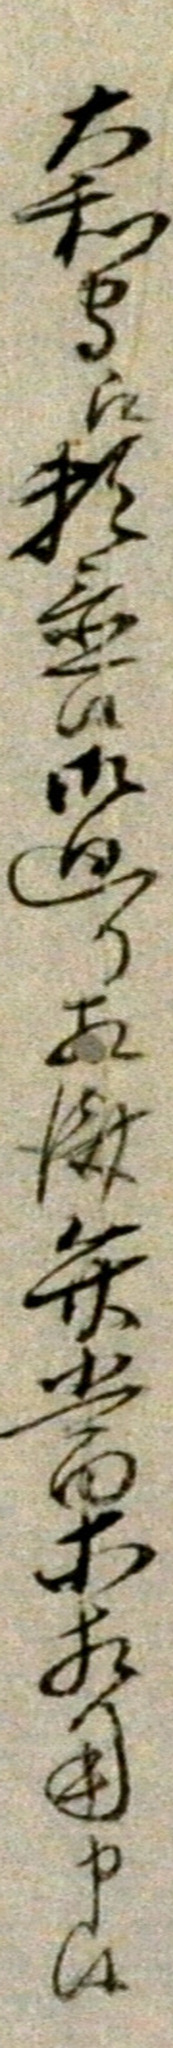大和守え頼置候御廻り相済弁当等相用申候
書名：御鏡餅御用留（写）
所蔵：伊那市立高遠町図書館・合同会社AMANE
